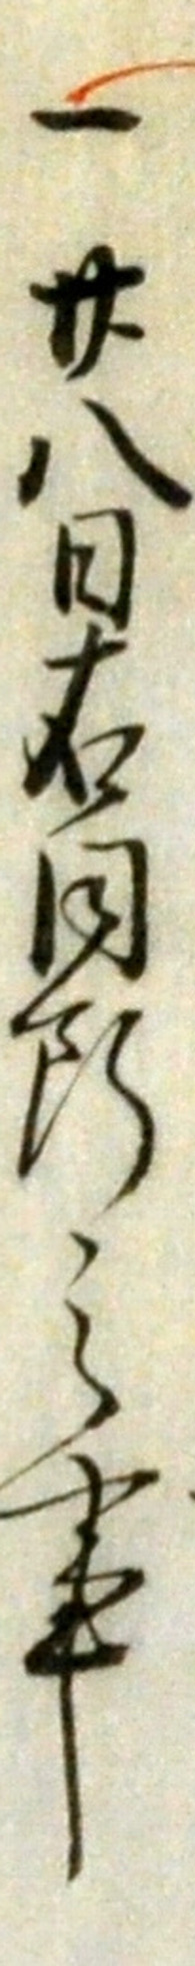一廿八日右同断之事
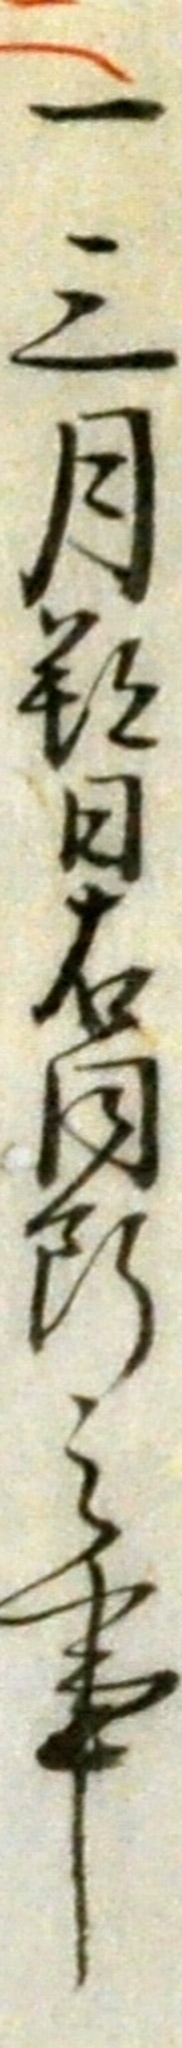一三月朔日右同断之事
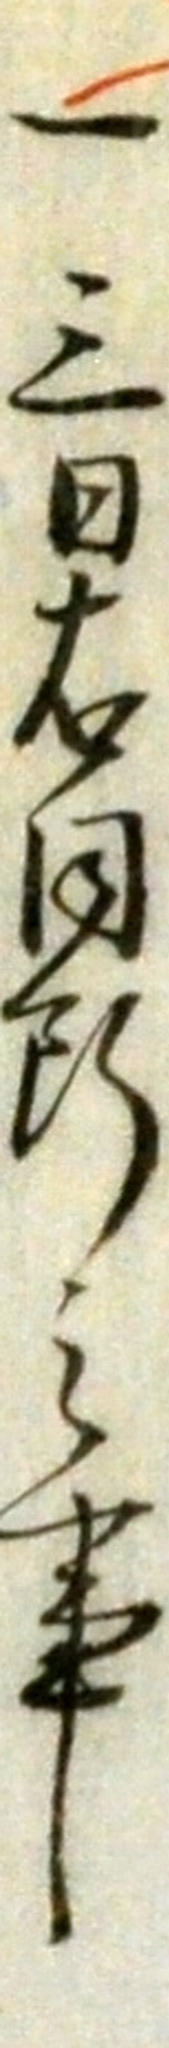一三日右同断之事
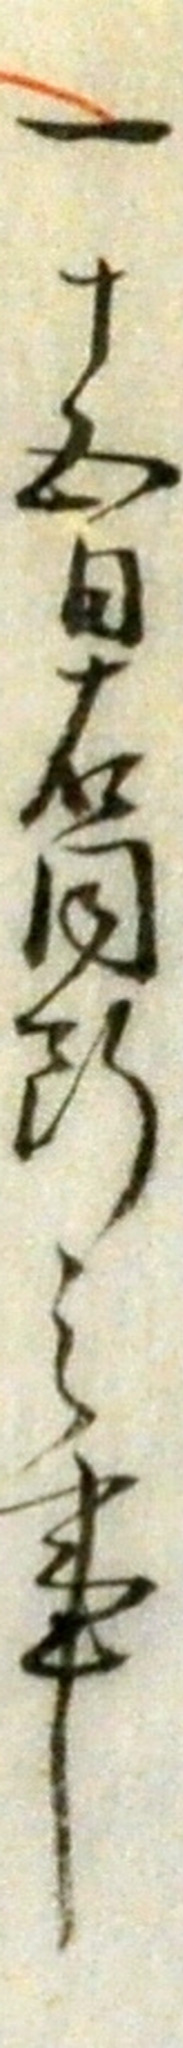一十五日右同断之事
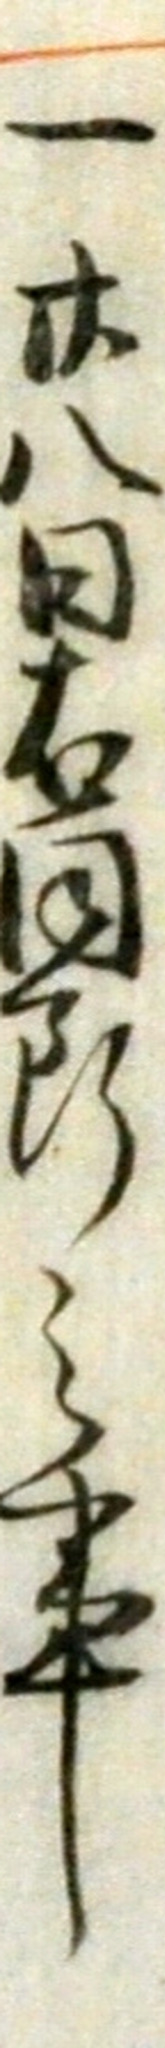一廿八日右同断之事
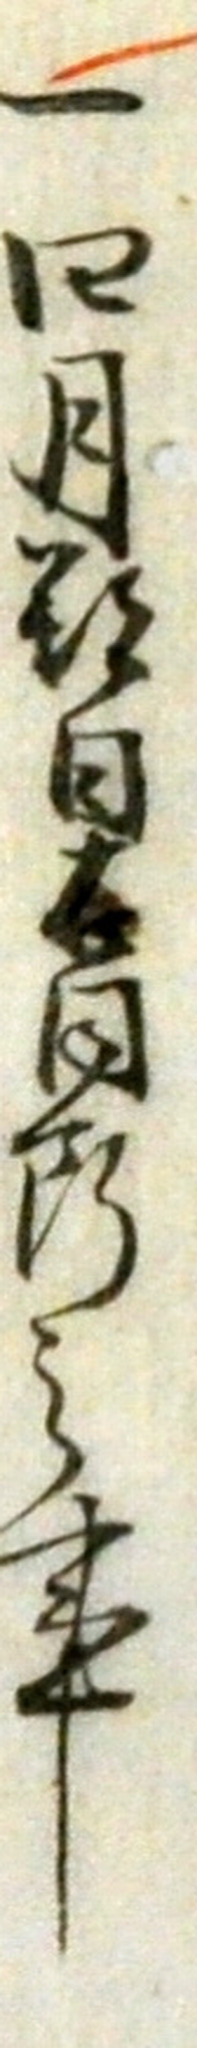一四月朔日右同断之事
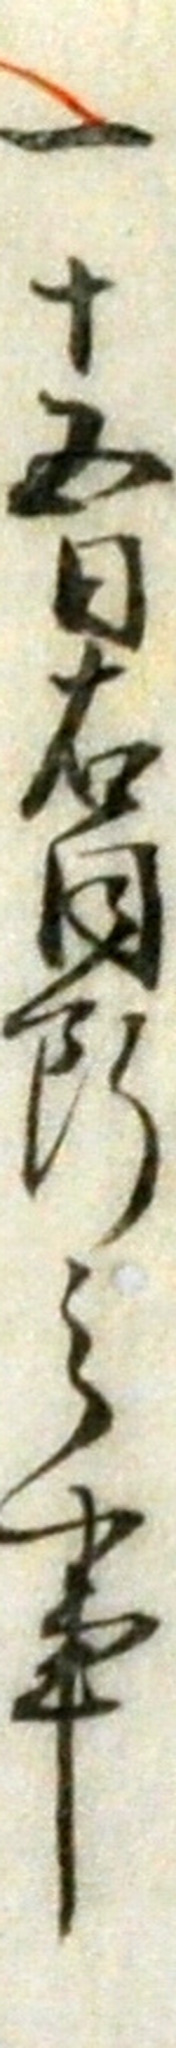一十五日右同断之事
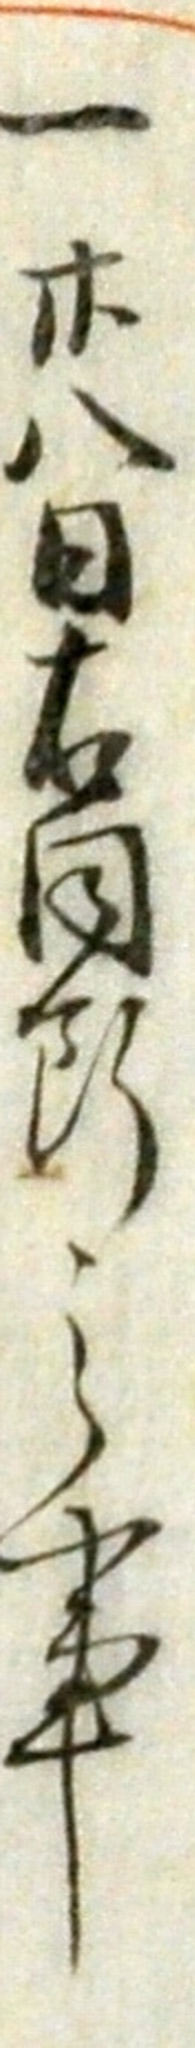一廿八日右同断之事
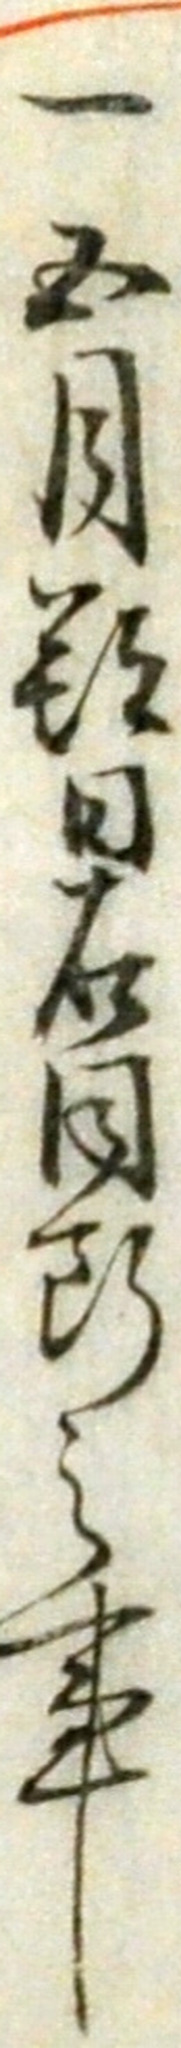一五月朔日右同断之事
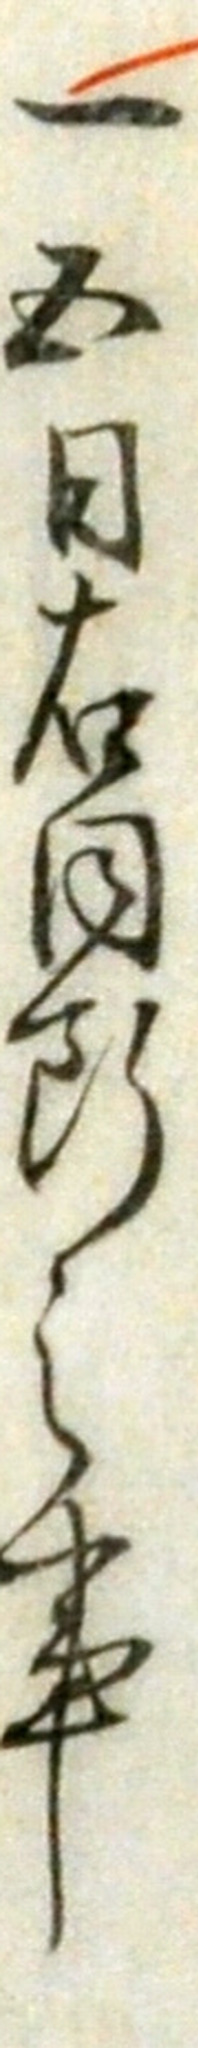一五日右同断之事
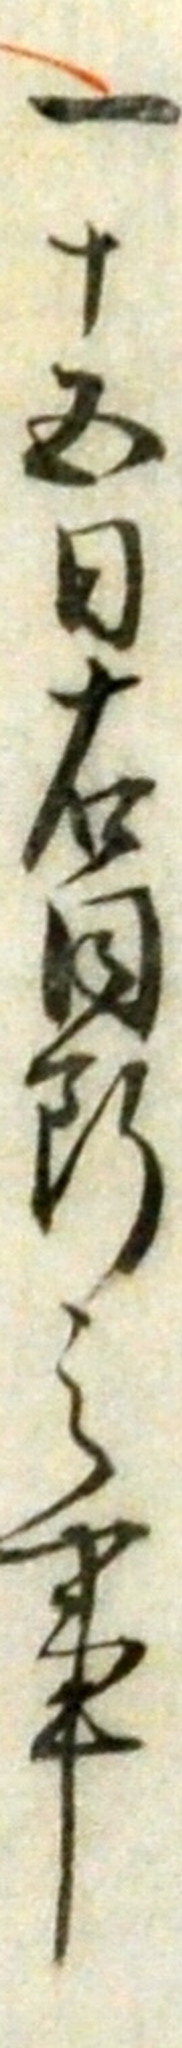一十五日右同断之事
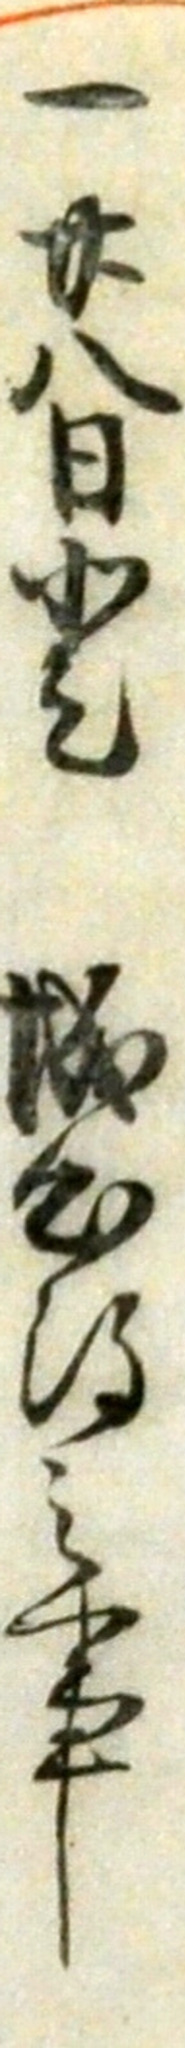一廿八日登城心得之事
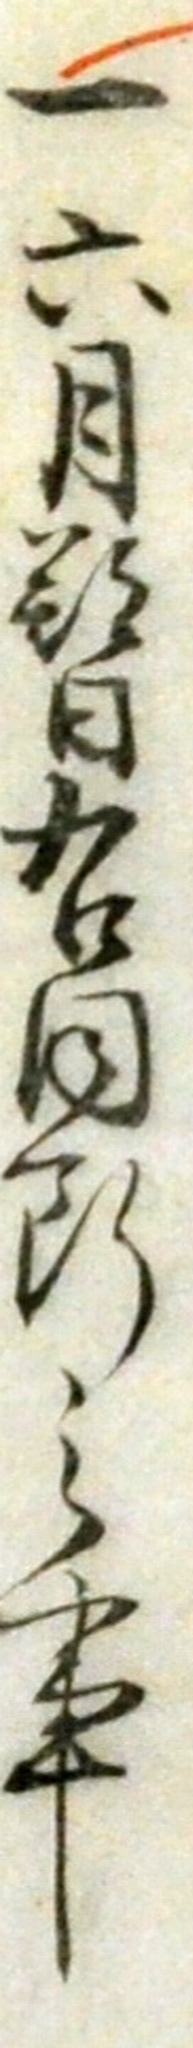一六月朔日右同断之事
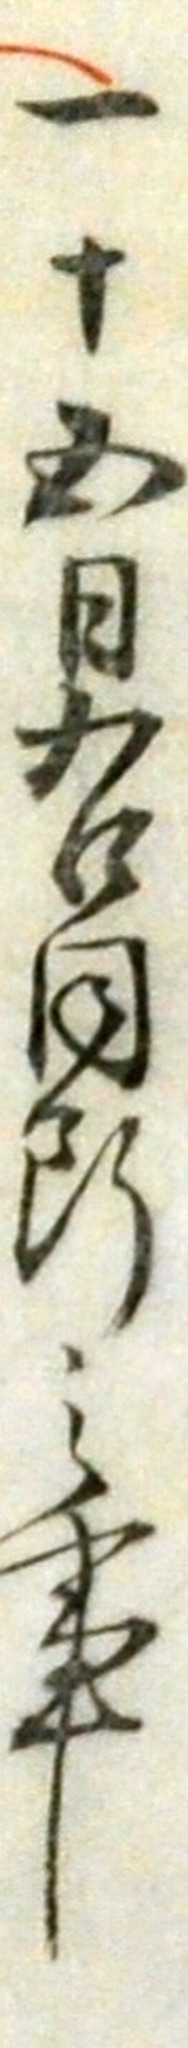一十五日右同断之事
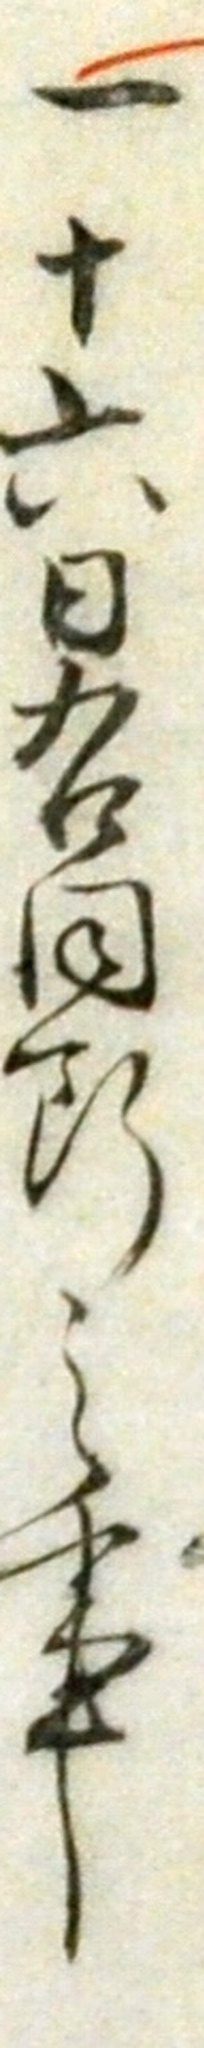一十六日右同断之事
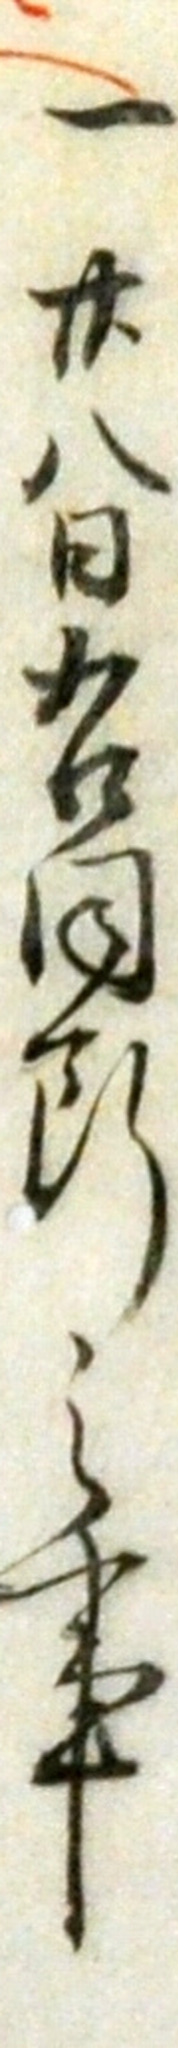一廿八日右同断之事
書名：申合帳〔一括〕
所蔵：伊那市立高遠町図書館・合同会社AMANE
